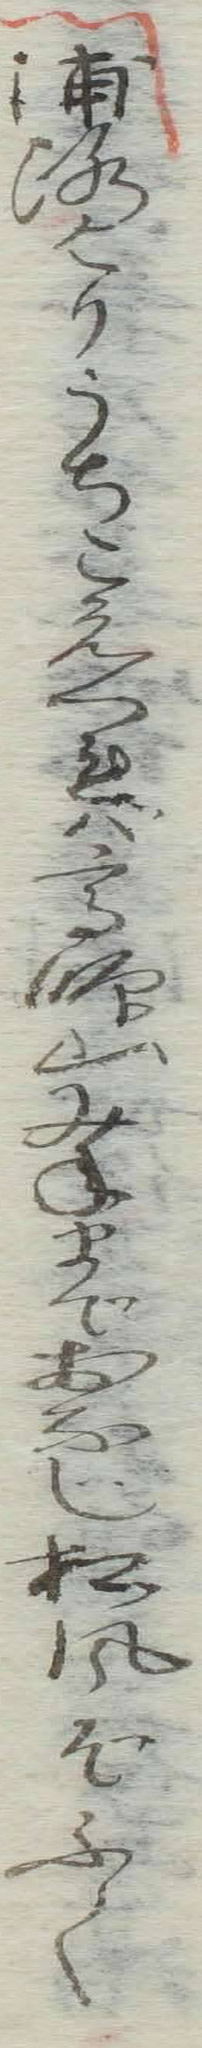〽浦路よりうちこえくれば高師山みねまでおなじ松風ぞふく
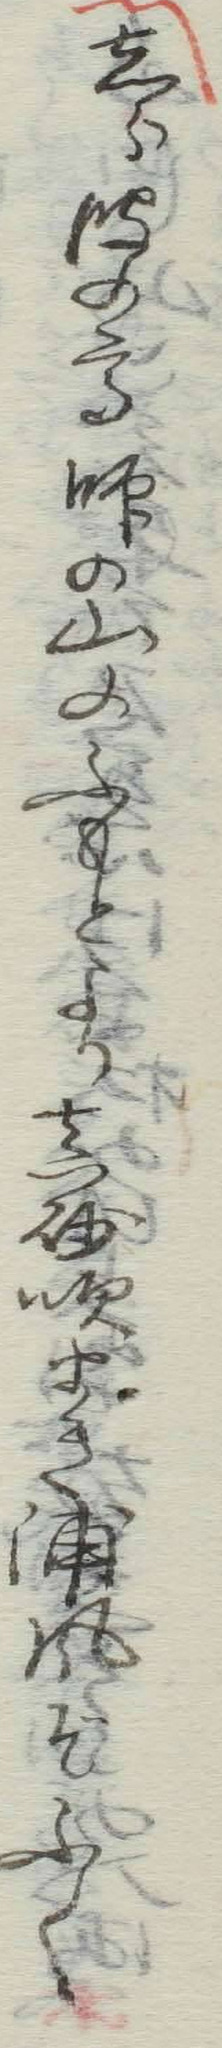〽しら波の高師の山のふもとより真砂ぞ吹まき浦風ぞふく
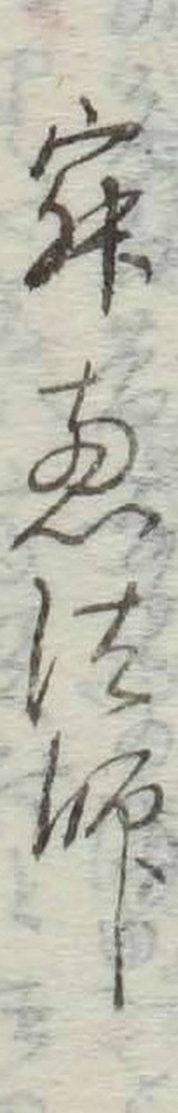寂恵法師
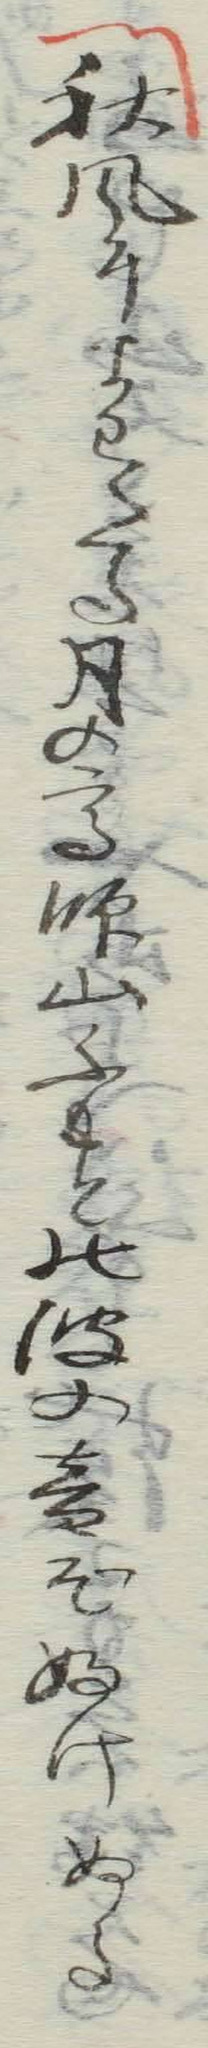〽秋風によわたる月の高師山ふもとの波の音ぞふけぬる
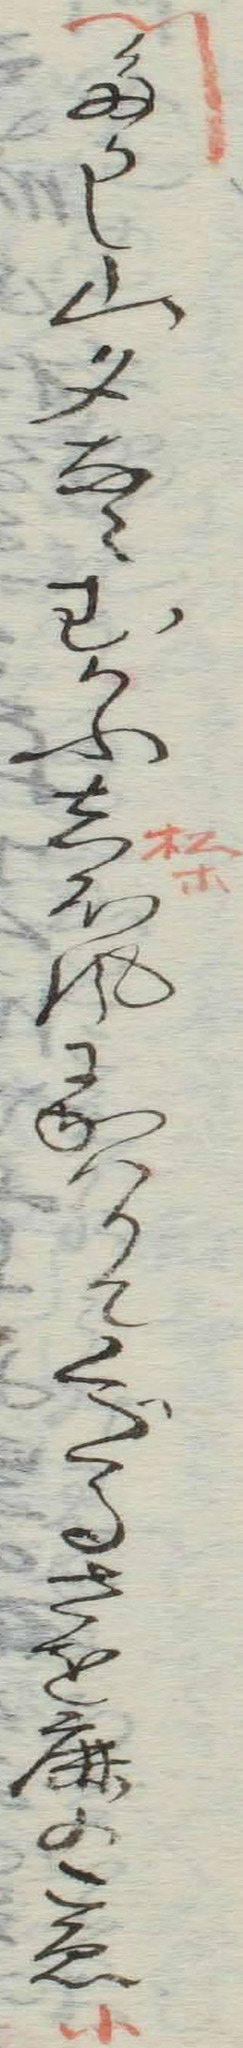〽たかし山夕なみむかふしほ風にかはりてくだるさを鹿のこゑ小
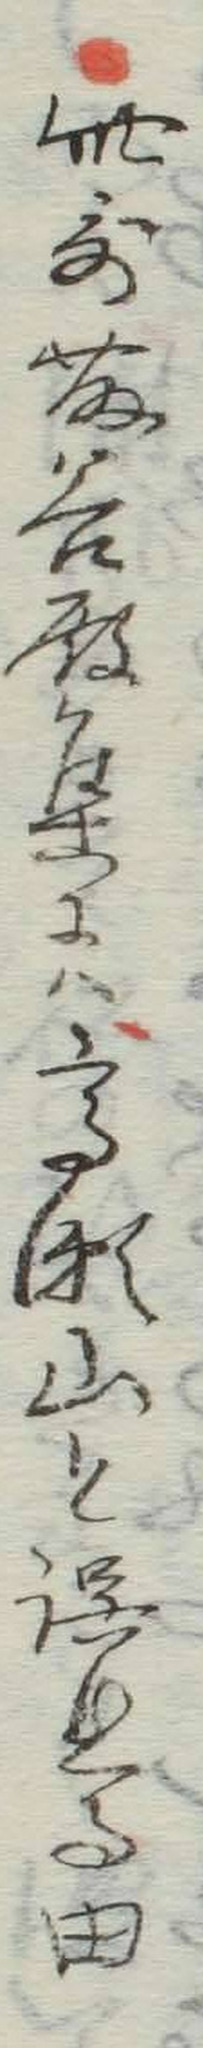●此歌藤谷殿集には、高瀬山と誤れる由
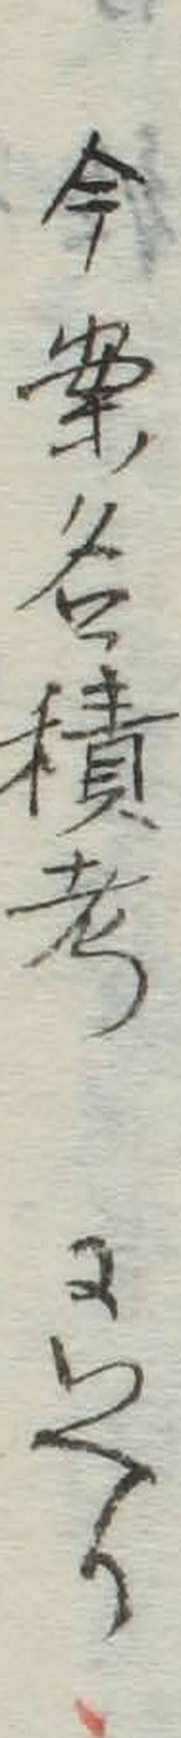今案名積考にいへり、
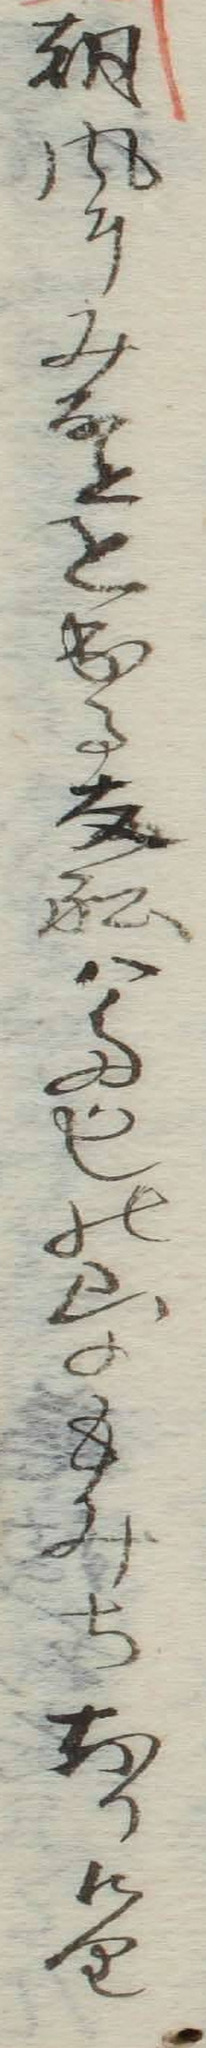〽朝風にみなとを出る友船はたかしの山のもみちなりけり
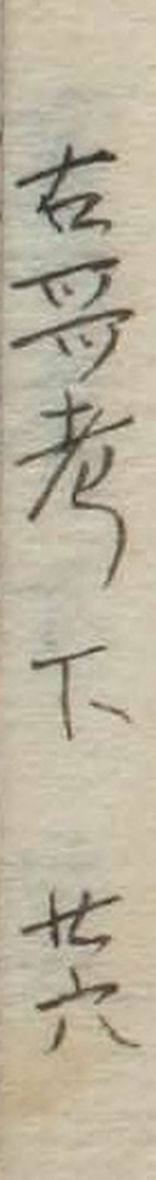古歌考下廿六

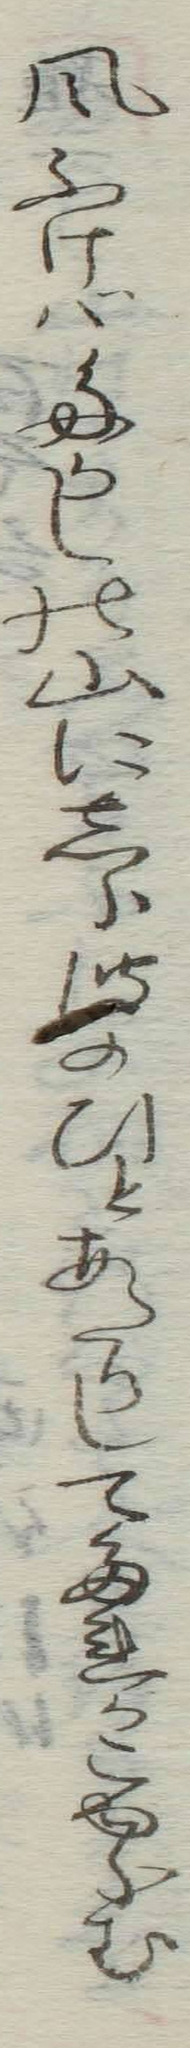風ふけばたかしの山にしら波のひとあたりしてたれかこゆらむ
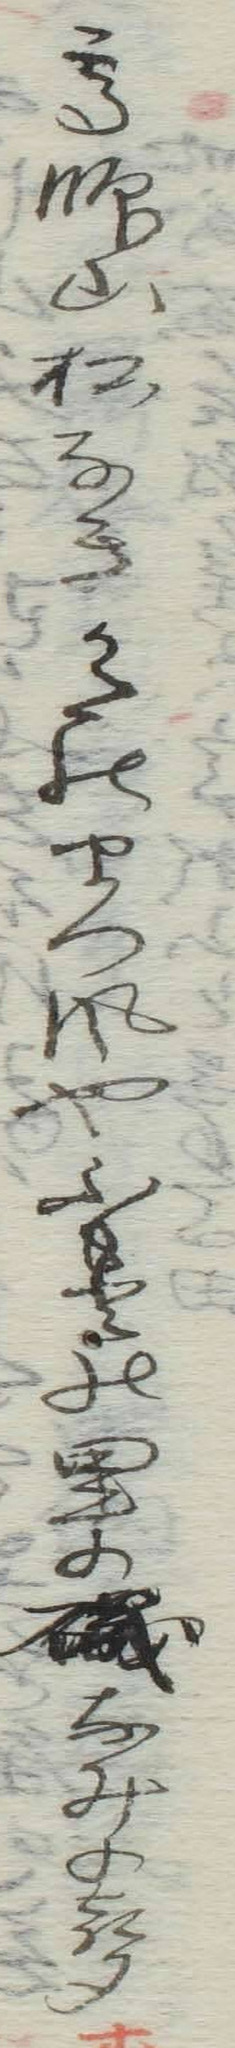高師山松なきかたのまつ風やふもとの里の磯なみの声ホ
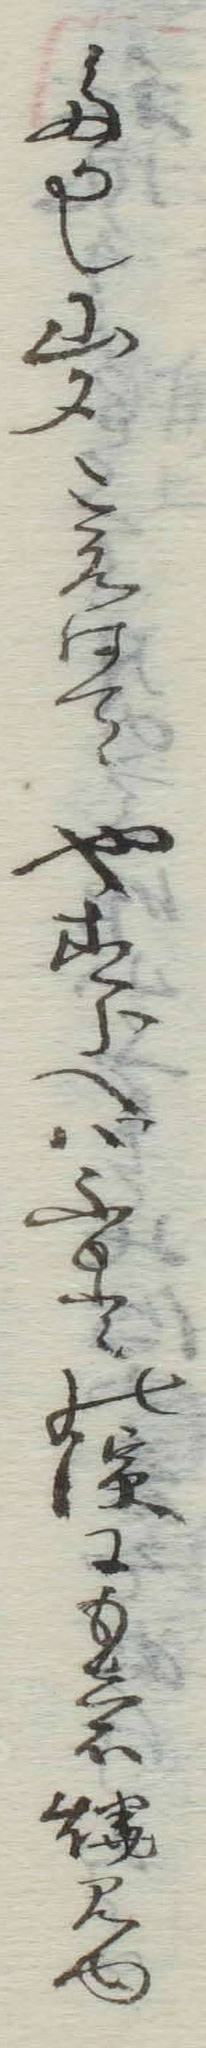たかし山夕こえはてゝやすらへばふもとの浜にもしほ焼見ゆ
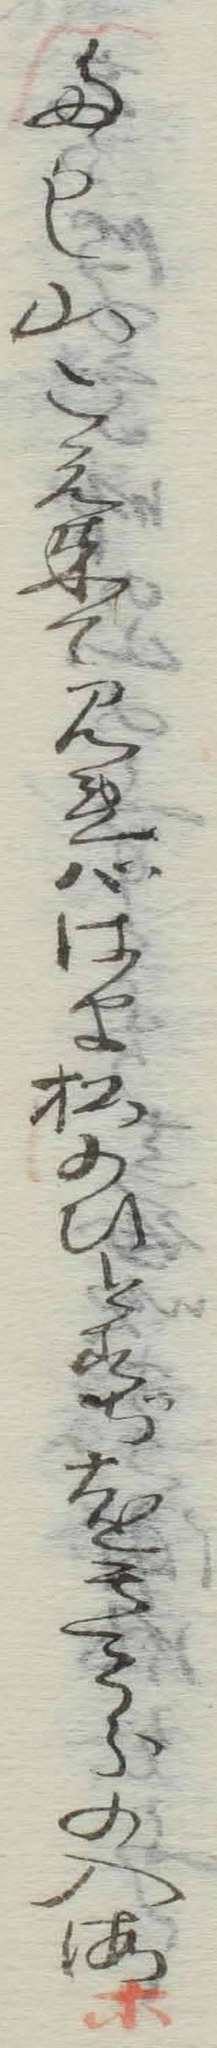たかし山こえ来て見ればはま松のひとすぢ遠きうらの入海ホ
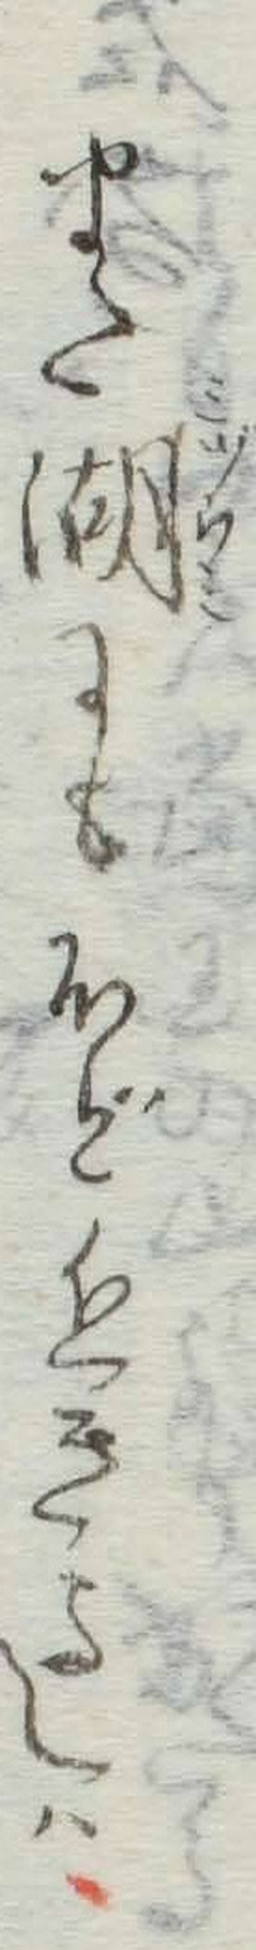また湖にもほど近きよしは、
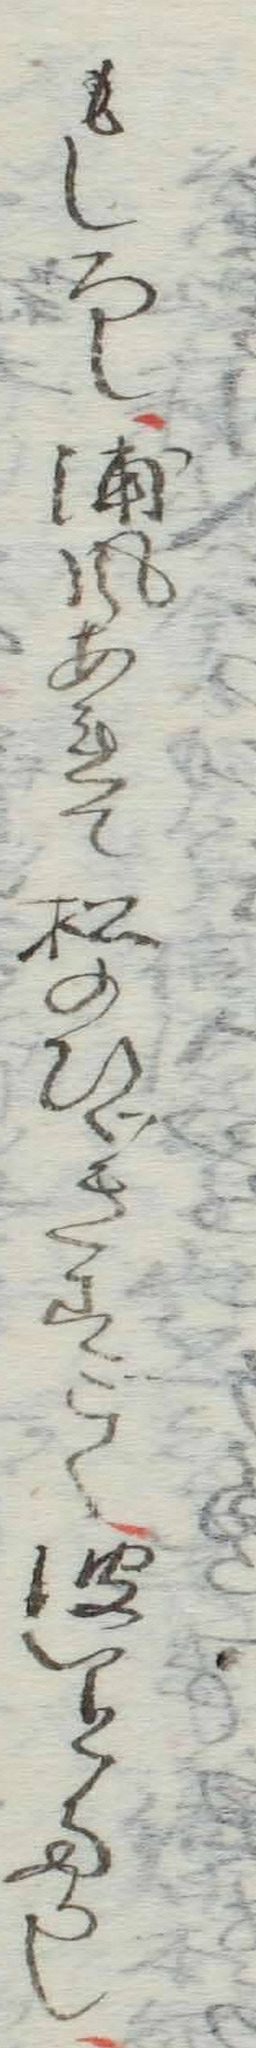もしろし、浦風あれて松のひゞきすごく、波いとたかし、
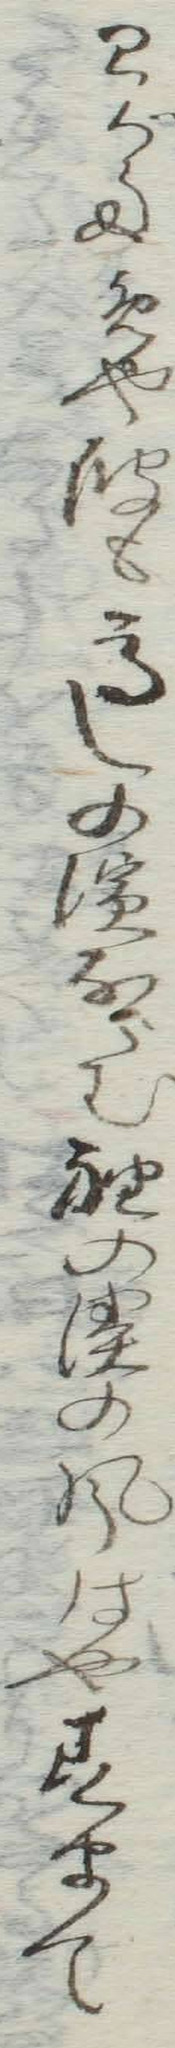わがためや波も高しの浜ならむ袖の湊の風はやすまて
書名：三河国古跡考
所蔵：国文学研究資料館
